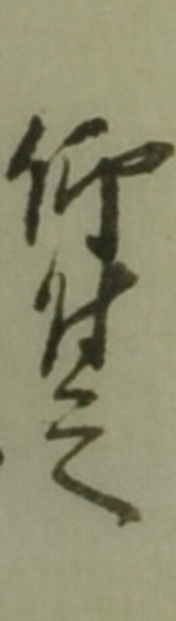仰付之
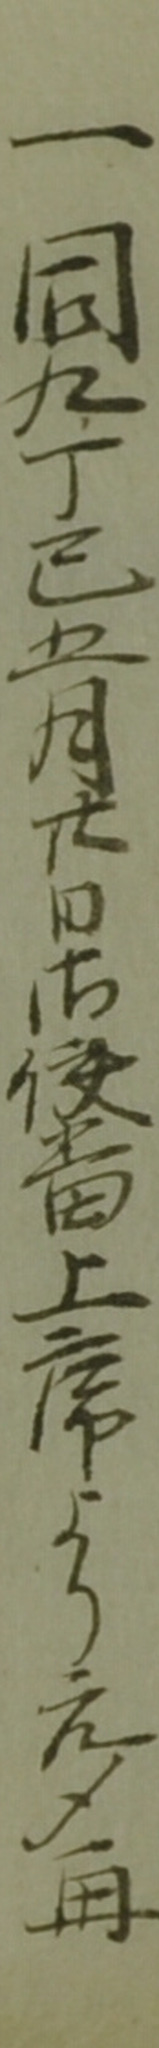一同九丁巳五月廿日御使番上席より元〆再
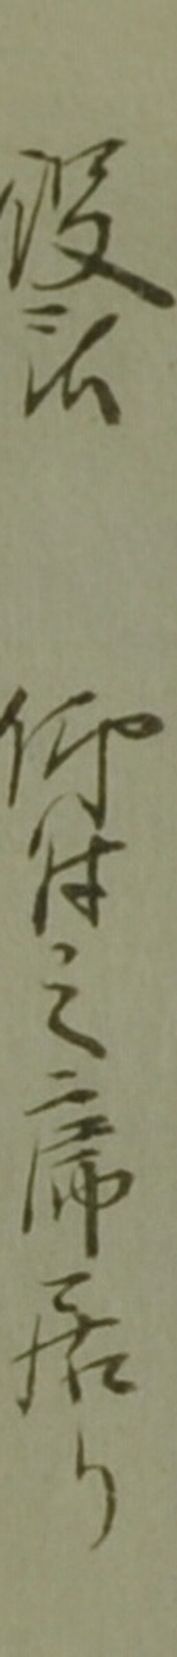役被仰付之席居り
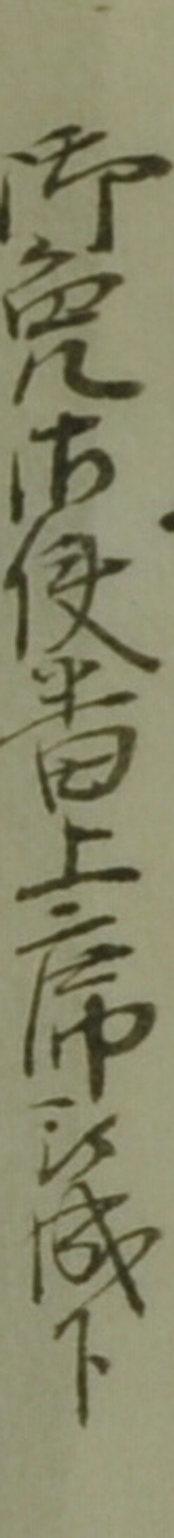御免御使番上席被成下
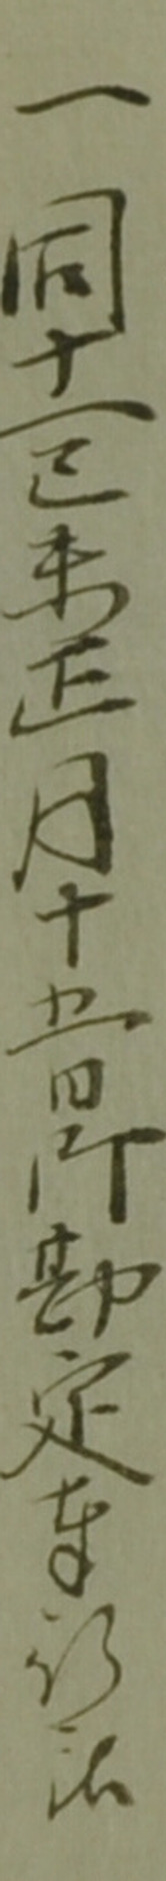一同十一己未正月十五日御勘定奉行被
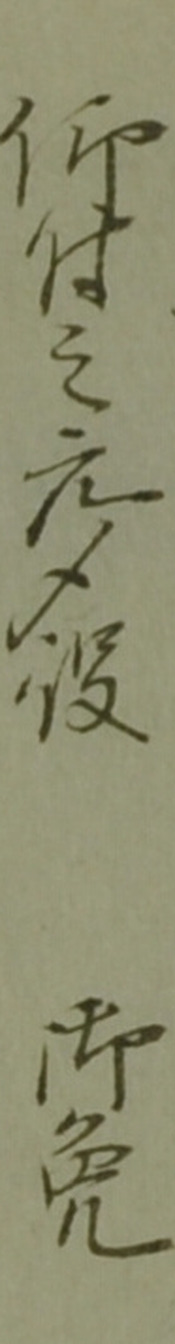仰付之元〆役御免
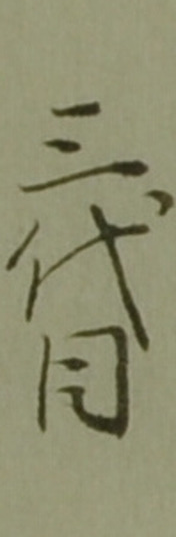三代目
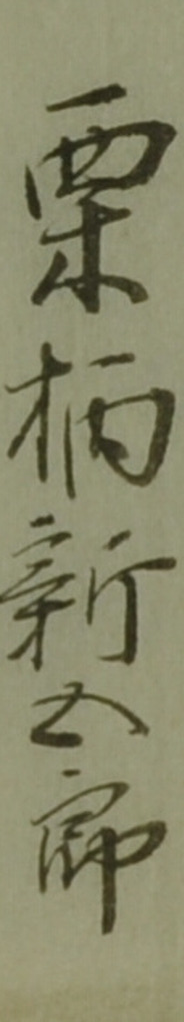栗栖新五郎
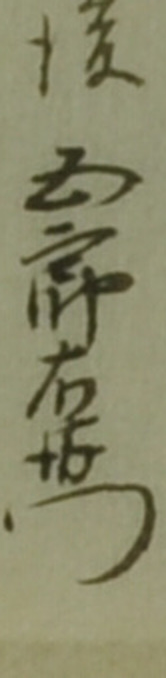後五郎右衛門
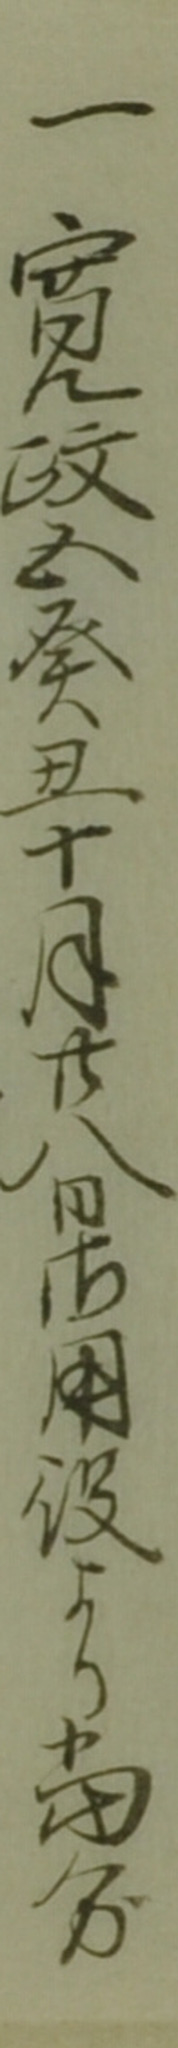一寛政五癸丑十月廿八日御用役より当分
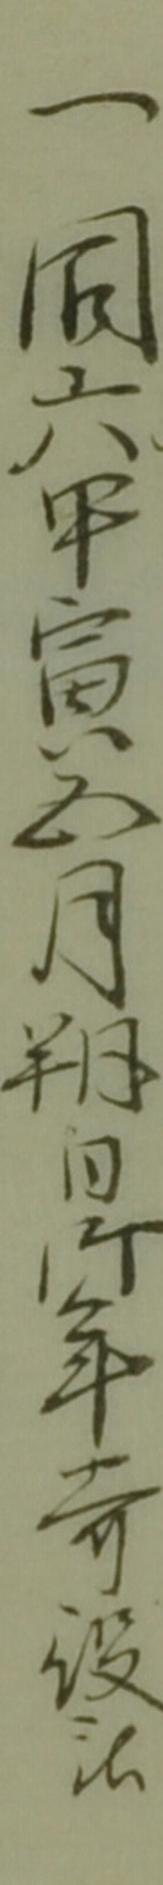一同六甲寅五月朔日御年寄役被
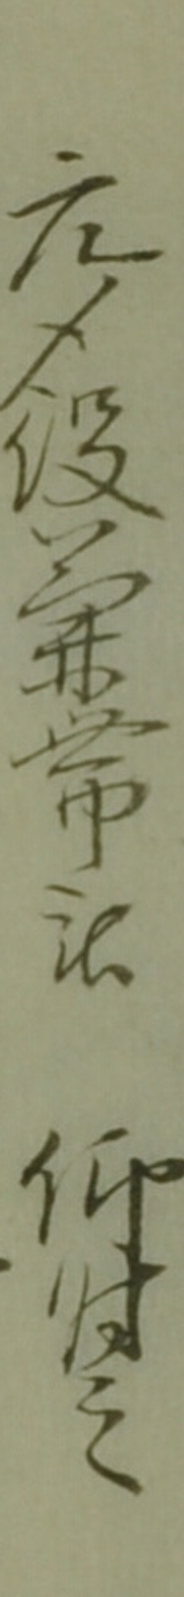元〆役兼帯被仰付之
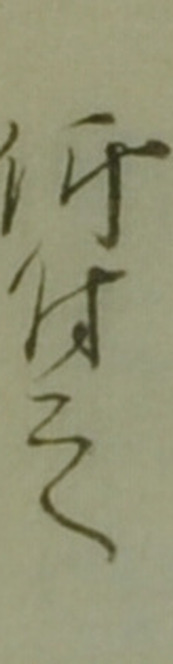仰付之
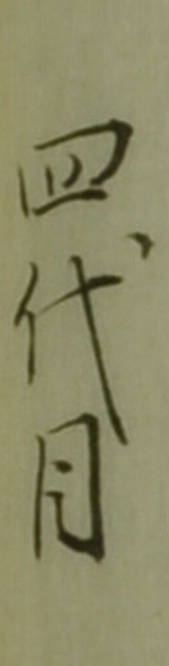四代目
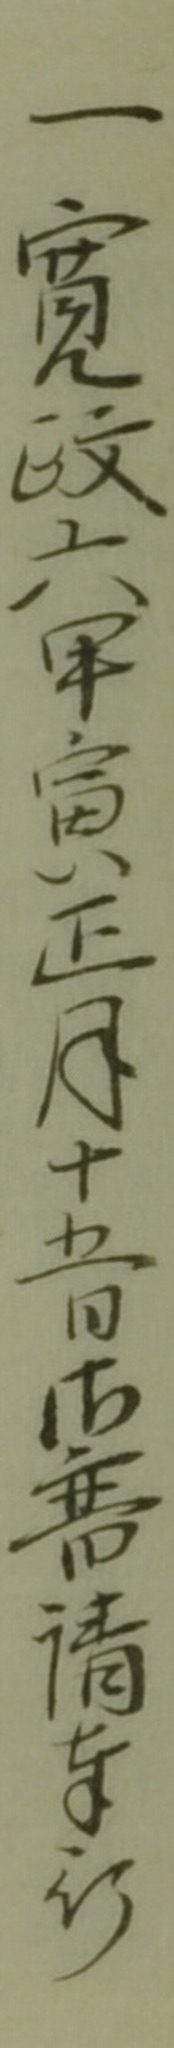一寛政六甲寅正月十五日御普請奉行
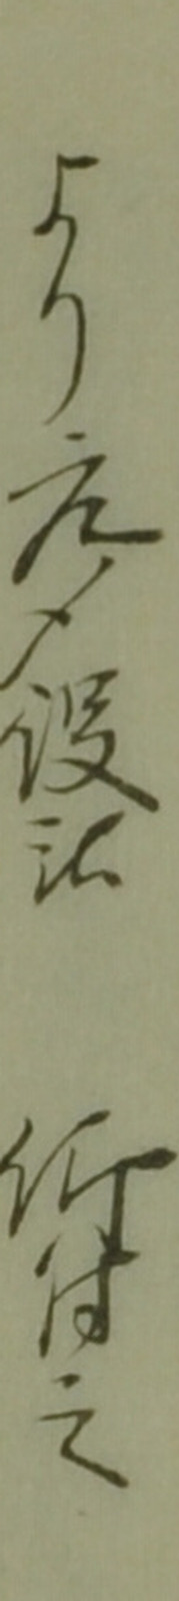より元〆役被仰付之
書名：諸御役代々録（七）
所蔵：伊那市立高遠町図書館・合同会社AMANE
